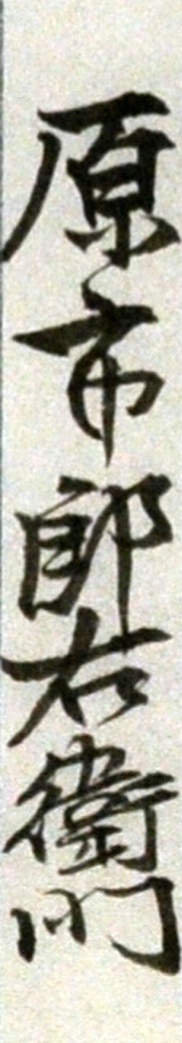一原市郎右衛門
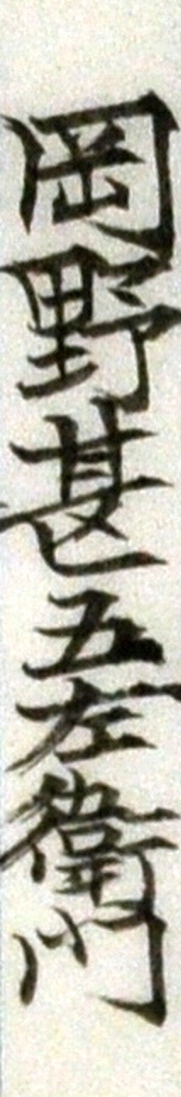一岡野甚五左衛門
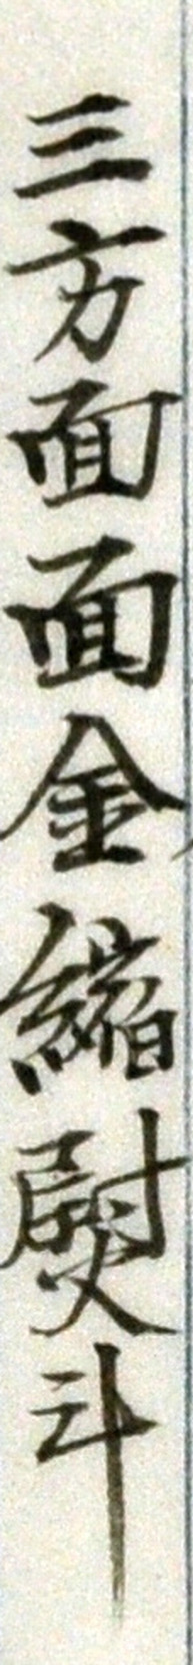三方面面金縮熨斗
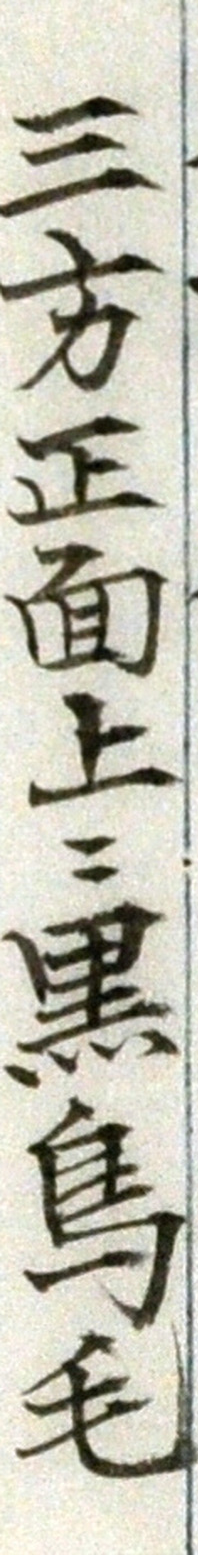三方正面上ニ黒鳥毛
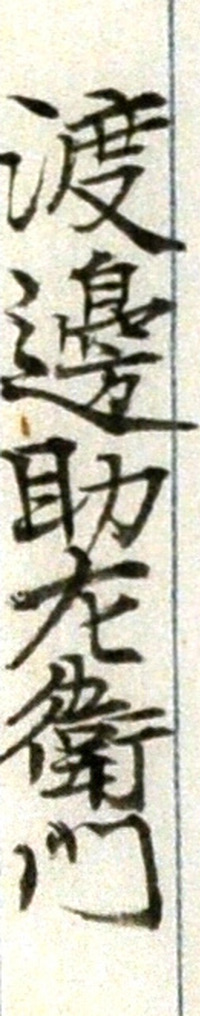一渡邊助左衛門

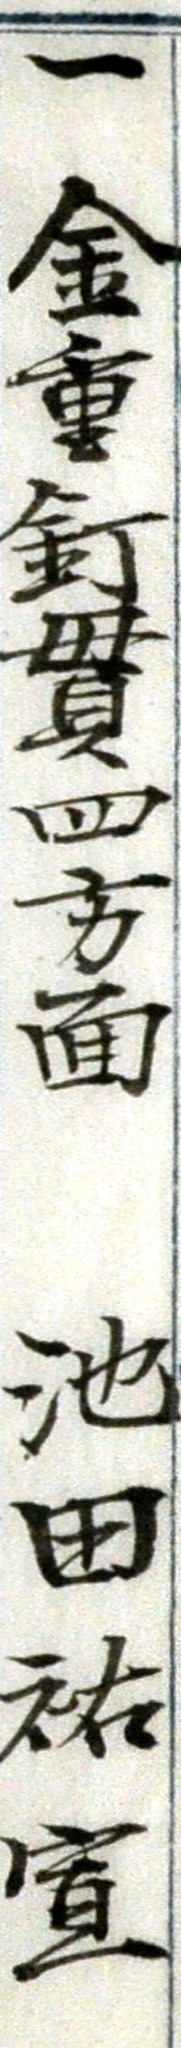一金重釘貫四方面池田祐宜
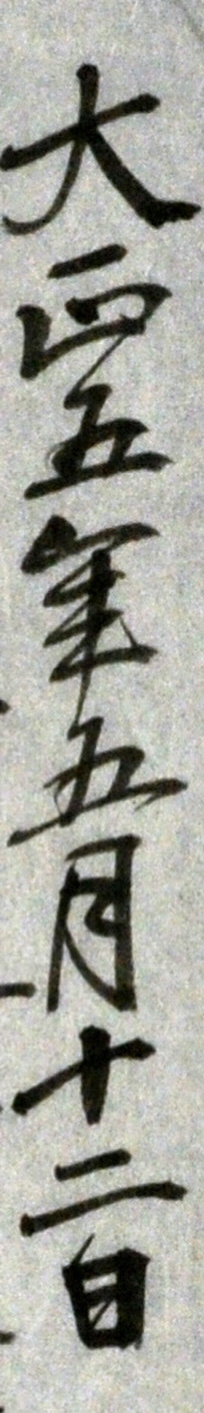大正五年五月十二日
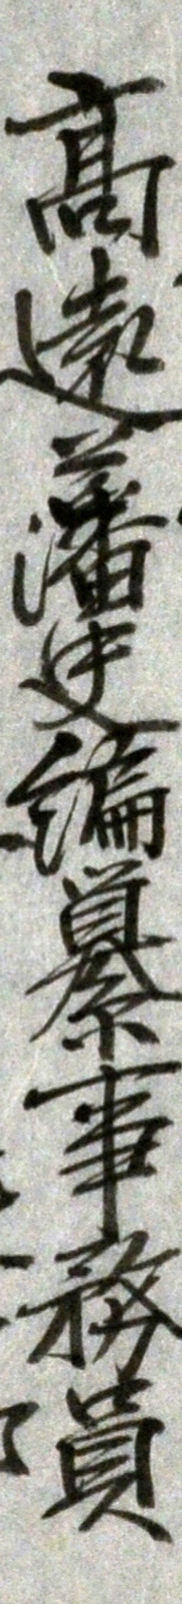高遠藩史編纂事務員
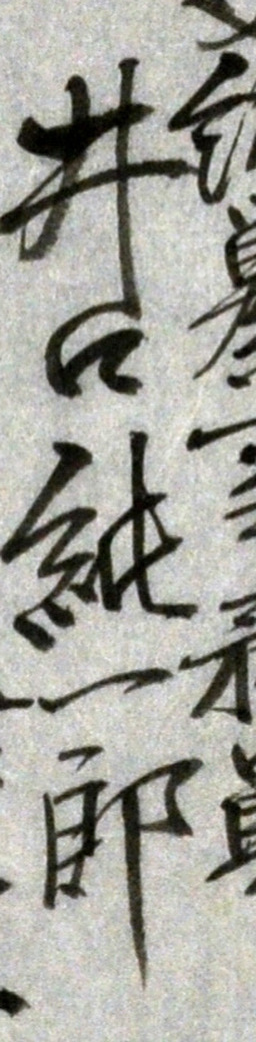井口純一郎
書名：江戸高遠出シ品附之写
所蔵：伊那市立高遠町図書館・合同会社AMANE
